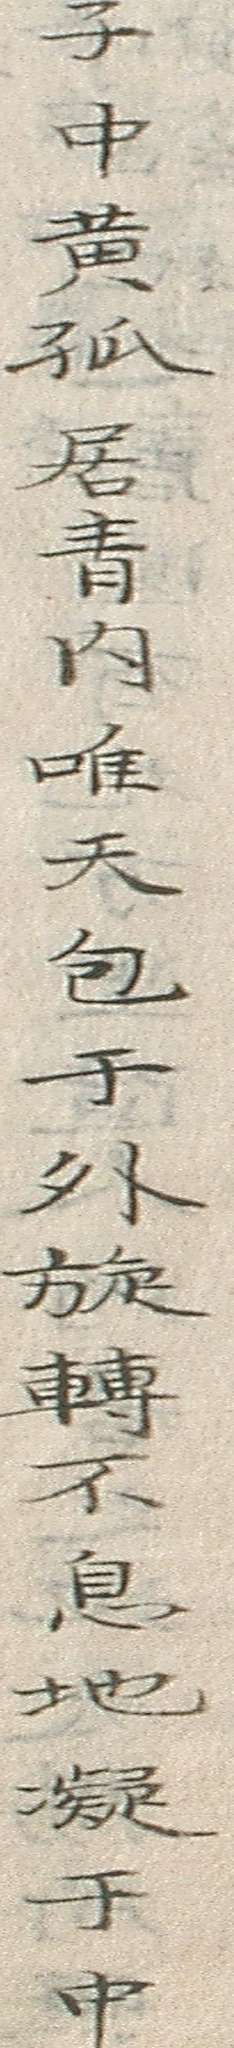子中黄孤居青内唯天包于外旋転不息地凝于中
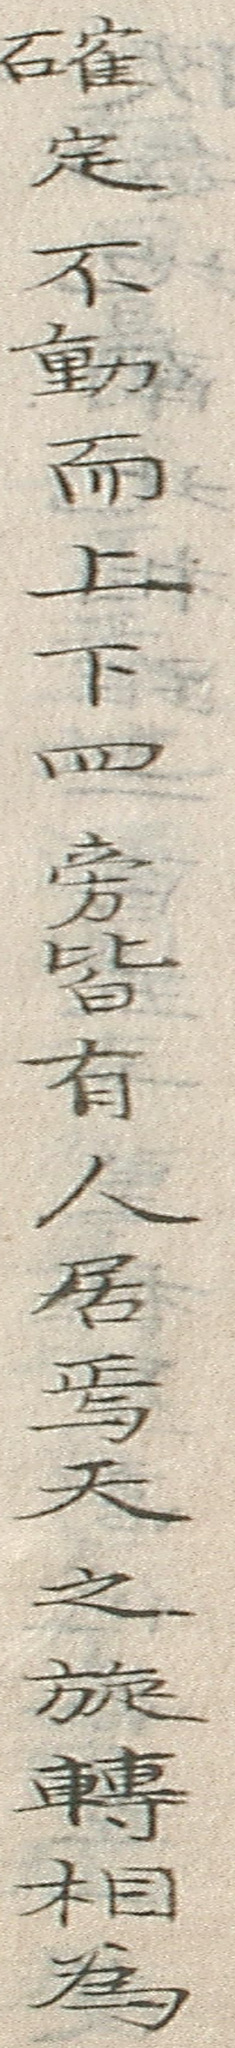確定不動而上下四旁皆有人居焉天之旋転相為
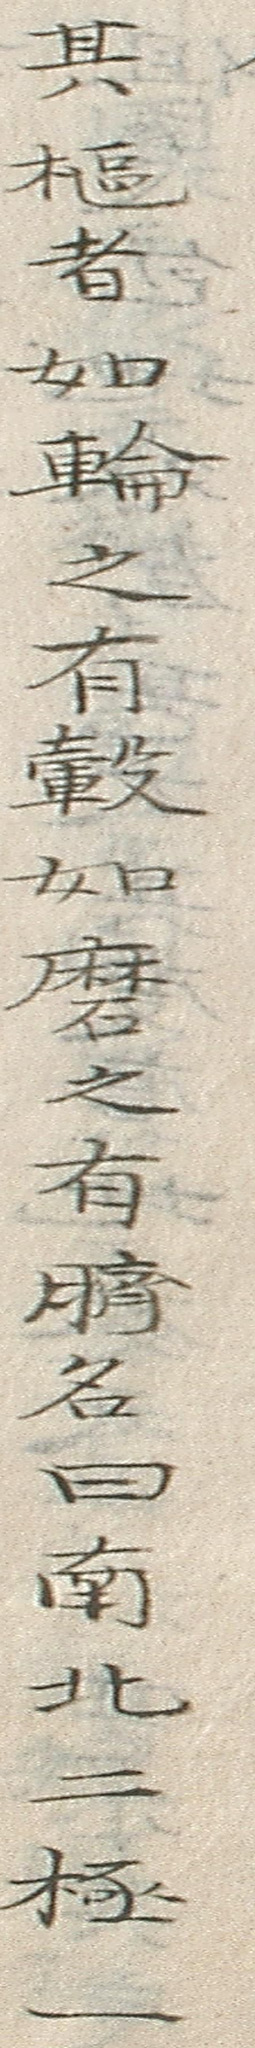其枢者如輪之有轂如磨之有臍名曰南北二極一
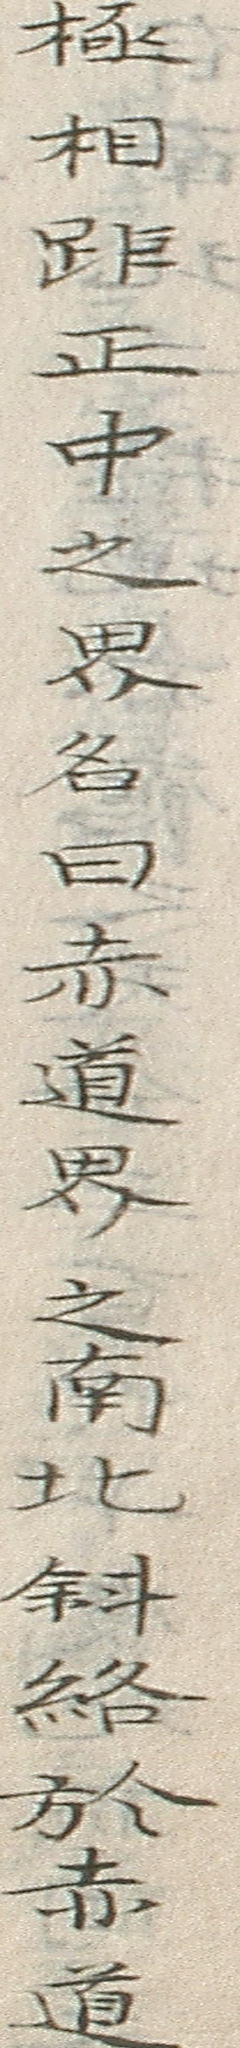極相距正中之界名曰赤道界之南北斜絡於赤道
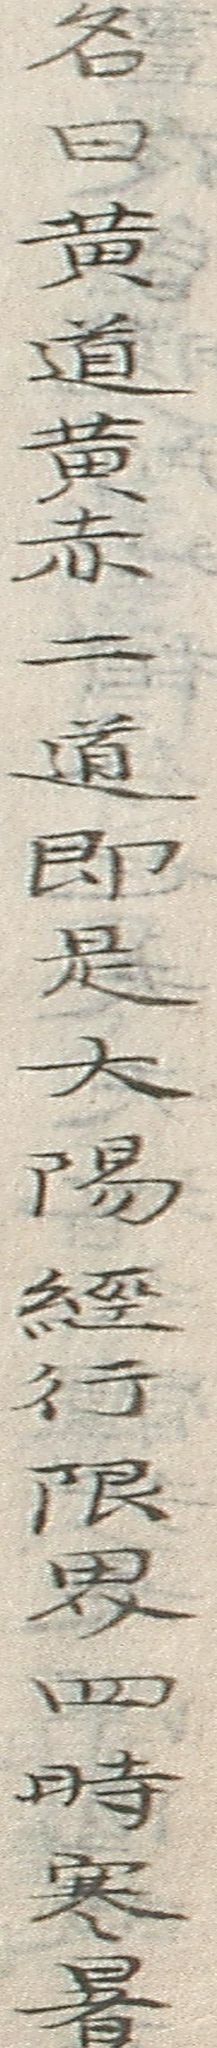名曰黄道黄赤二道即是大陽経行限界四時寒暑

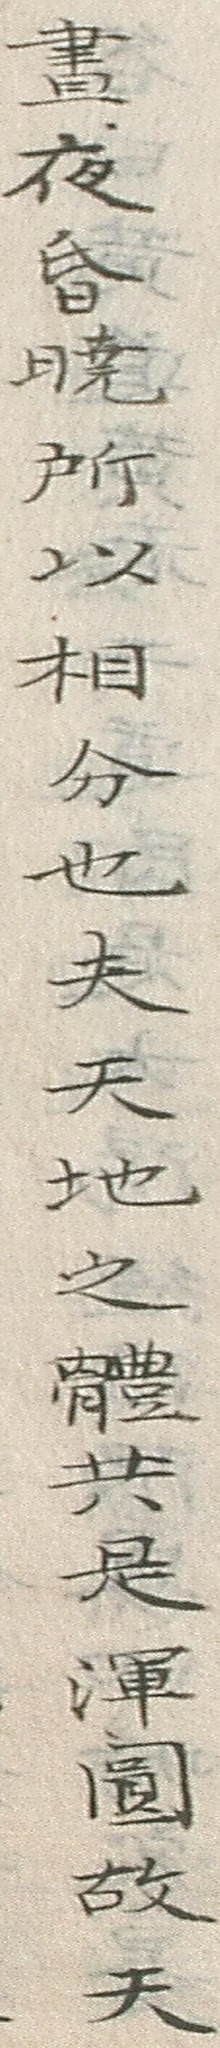昼夜昏暁所以相分也夫天地之体共是渾円故天
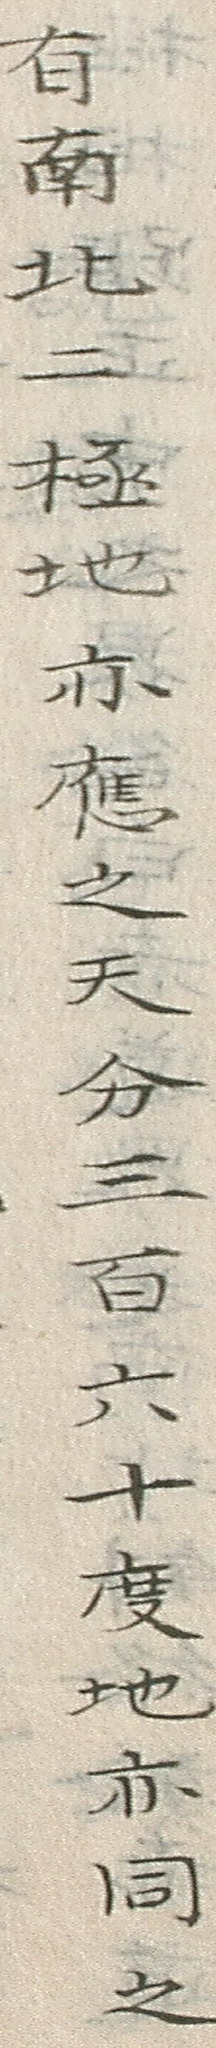有南北二極地亦応之天分三百六十度地亦同之
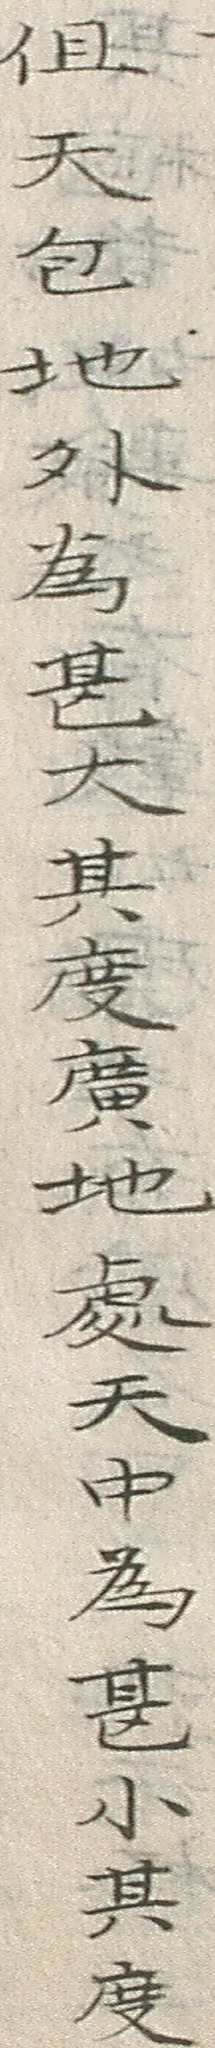但天包地外為甚大其度広地処天中為甚小其度
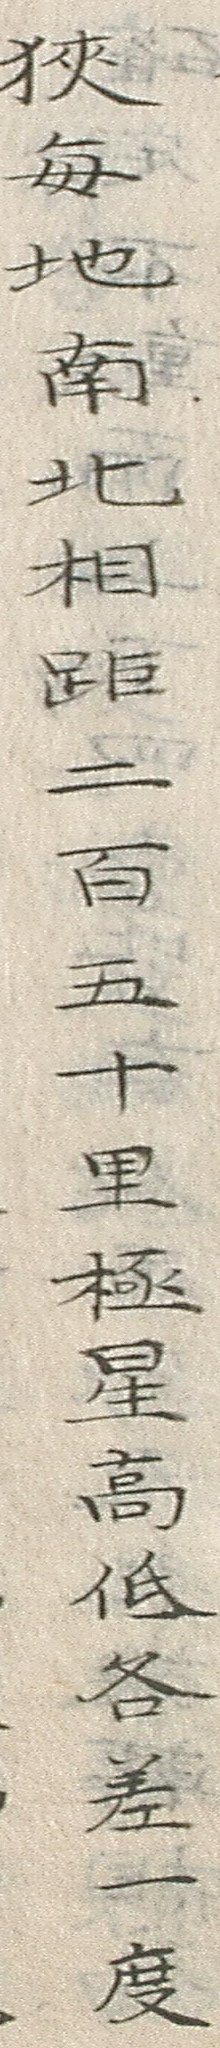狭毎地南北相距二百五十里極星高低各差一度
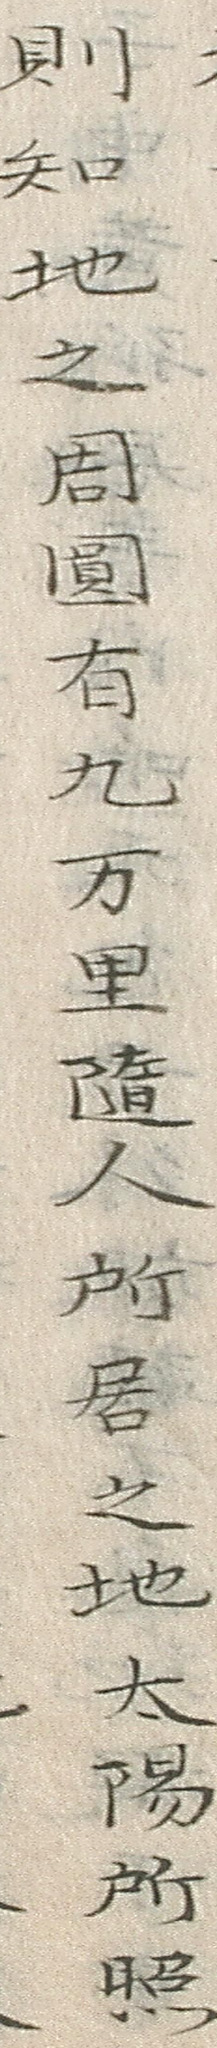則知地之周円有九万里随人所居之地太陽所照
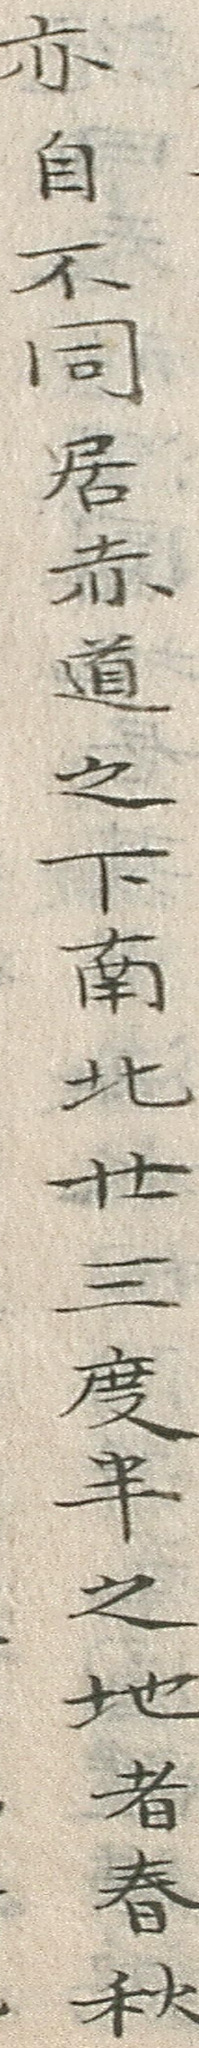亦自不同居赤道之下南北廿三度半之地者春秋
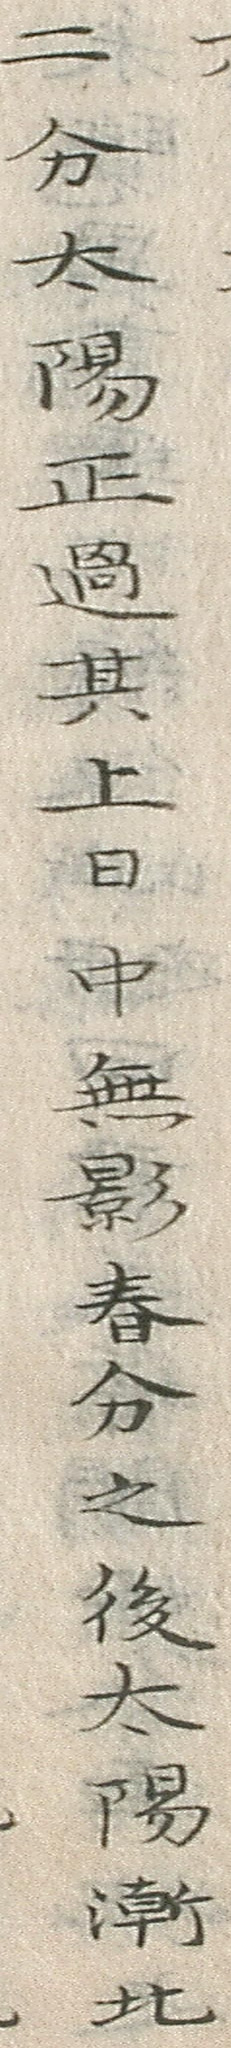二分太陽正過其上日中無影春分之後太陽漸北
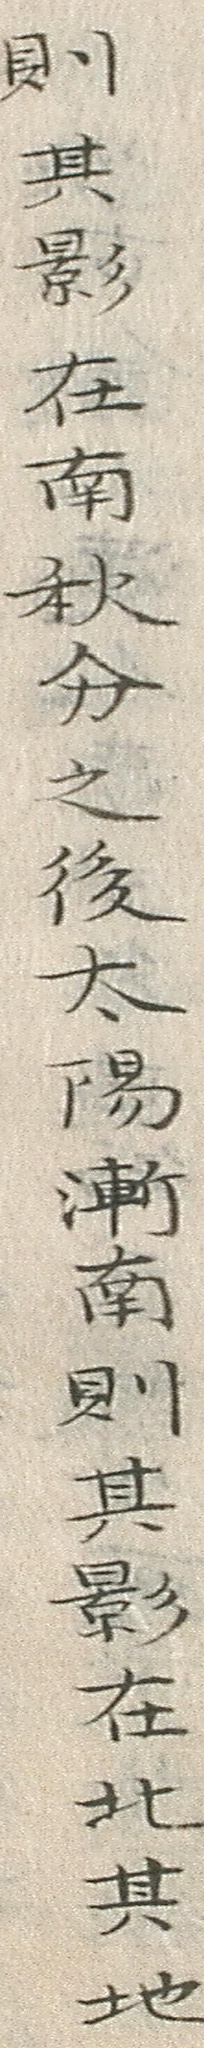則其影在南秋分之後太陽漸南則其影在北其地
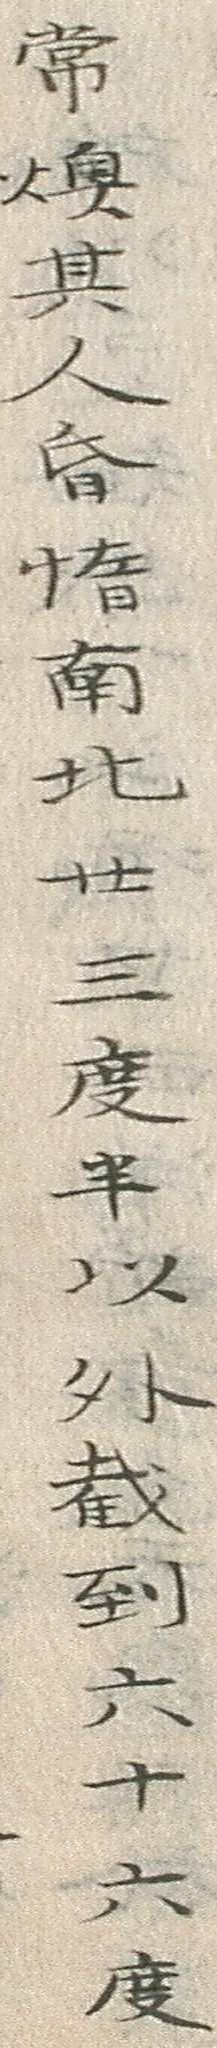常燠其人昏惰南北廿三度半以外截到六十六度
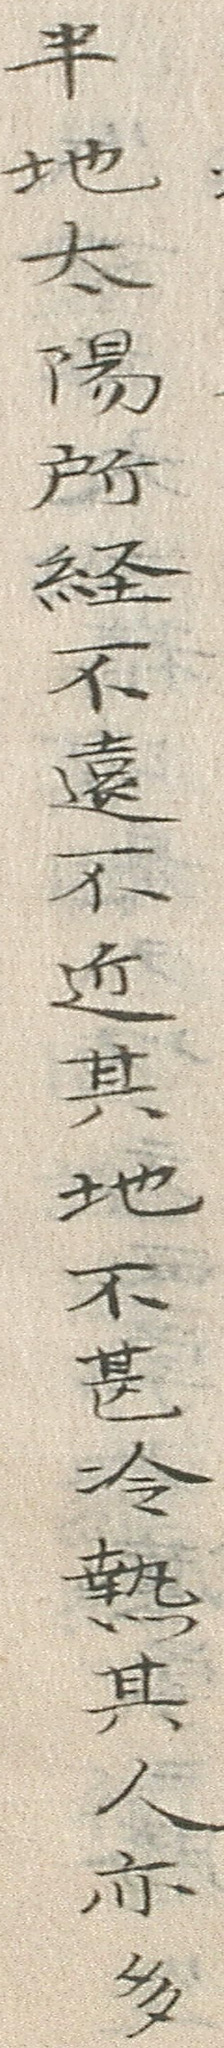半地太陽所経不遠不近其地不甚冷熱其人亦多
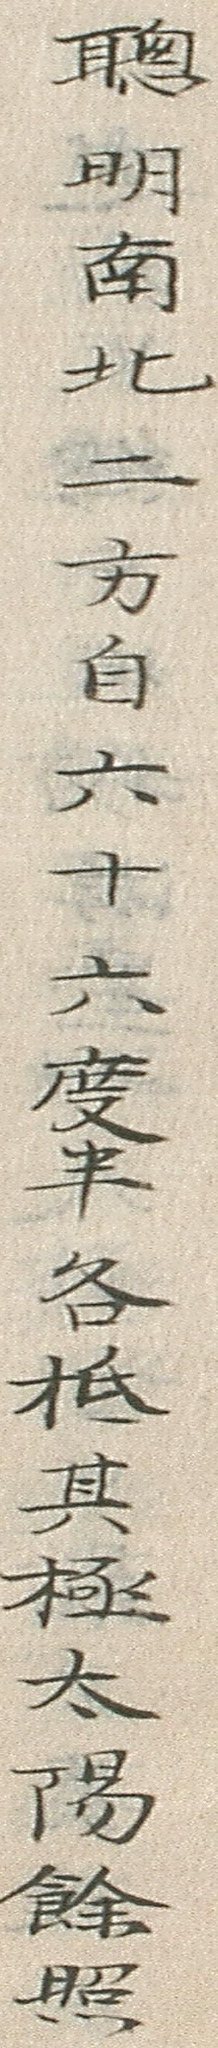聡明南北二方自六十六度半各抵其極太陽余照
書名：天學略名目羽翼　全
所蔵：東京大学地震研究所図書室 Earthquake Research Institute Library, The University of Tokyo, JAPAN
